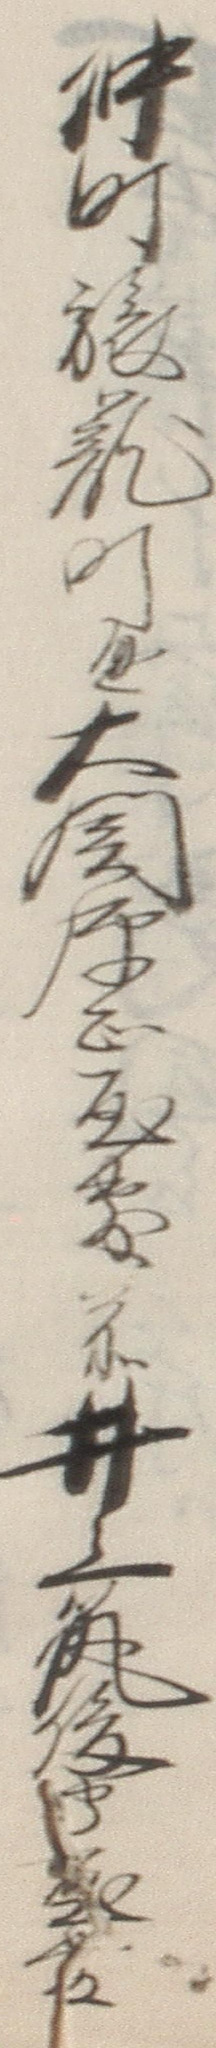沖町旅籠町通大関弾正屋敷前井上筑後守屋敷
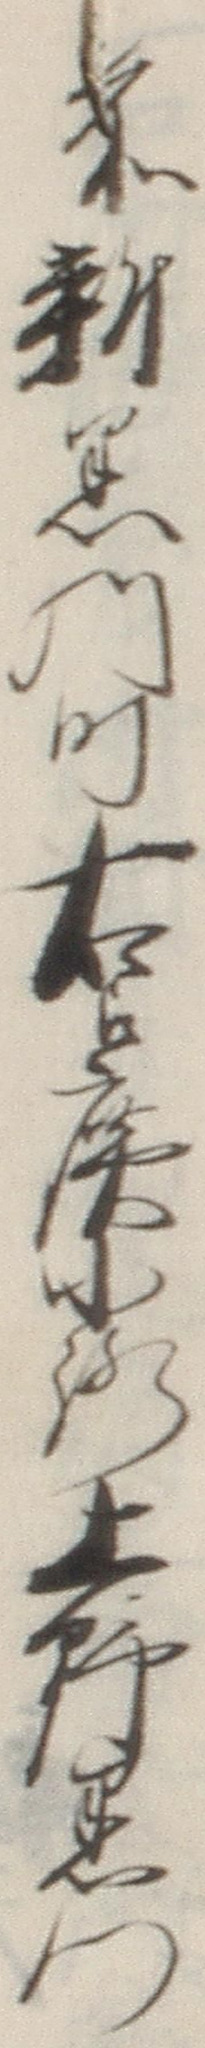前新黒門町右え広小路上野黒門
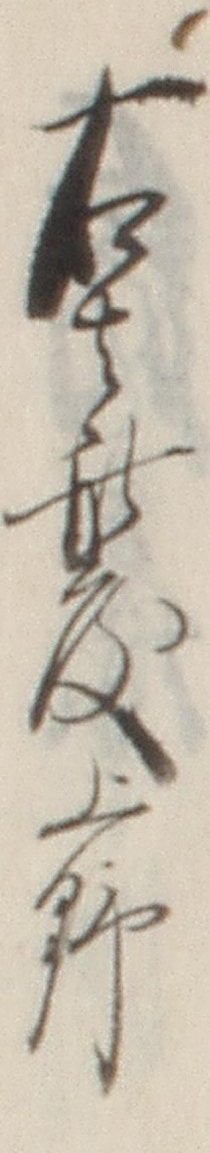右は此度上野

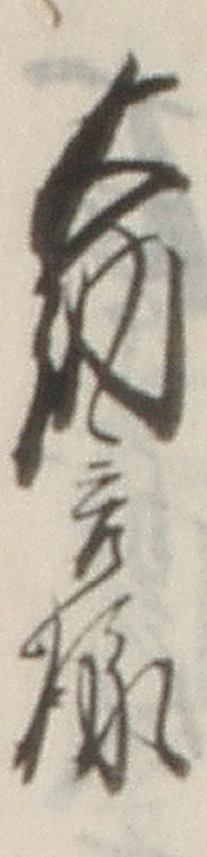大納言様
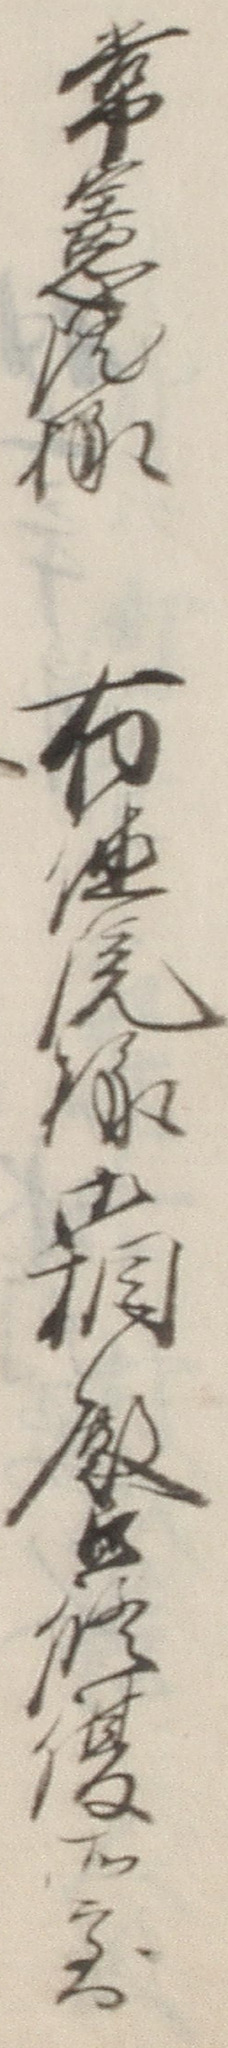常憲院様有徳院様御相殿え修復所寄
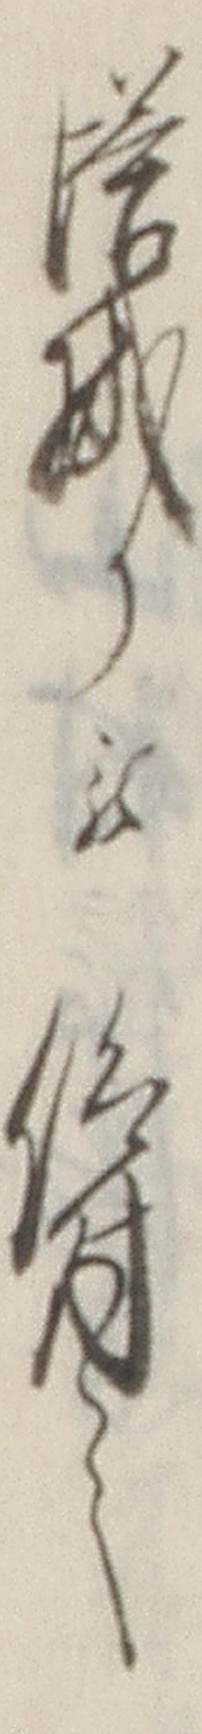塔掛り被仰付候
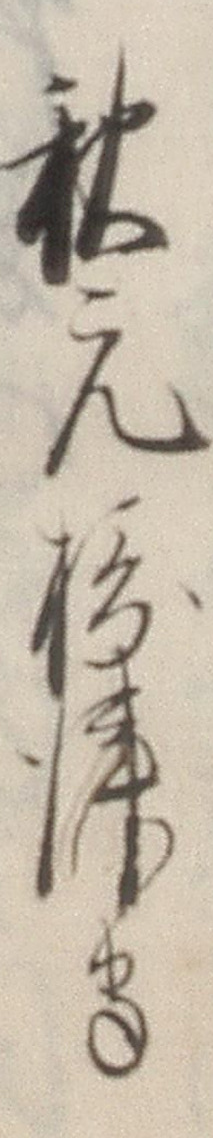秋元摂津守
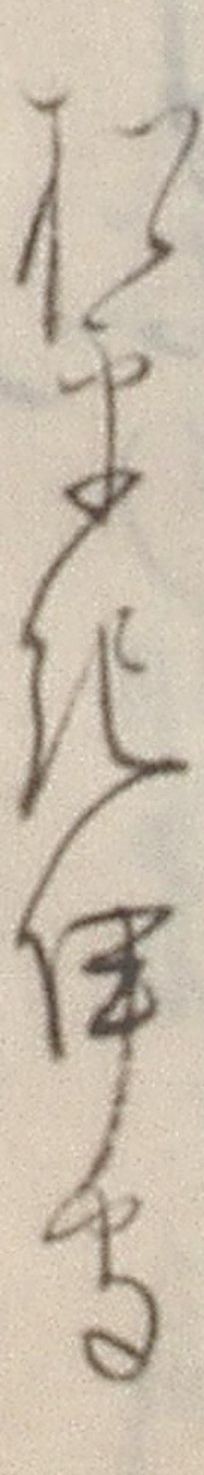松平紀伊守
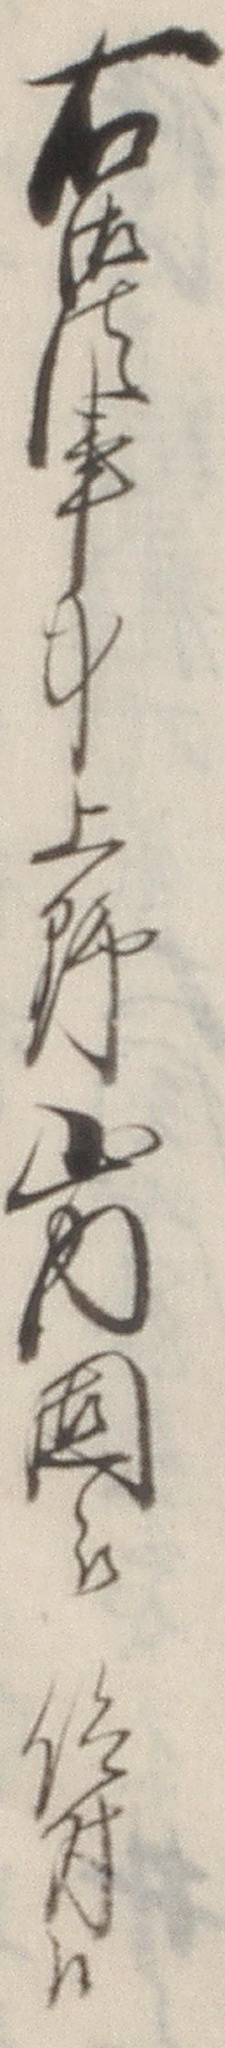右御法事中上野山内固被仰付候
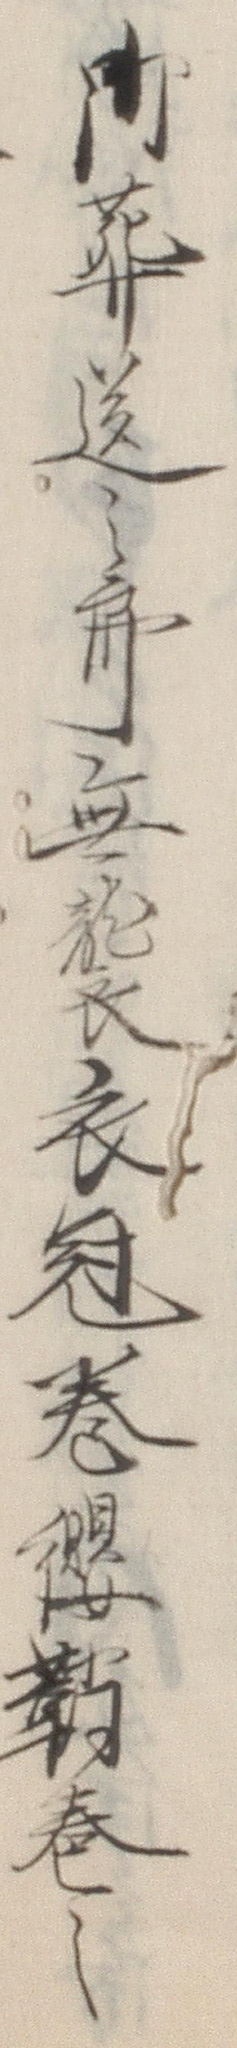御葬送之節無襲衣冠巻纓鞘巻之
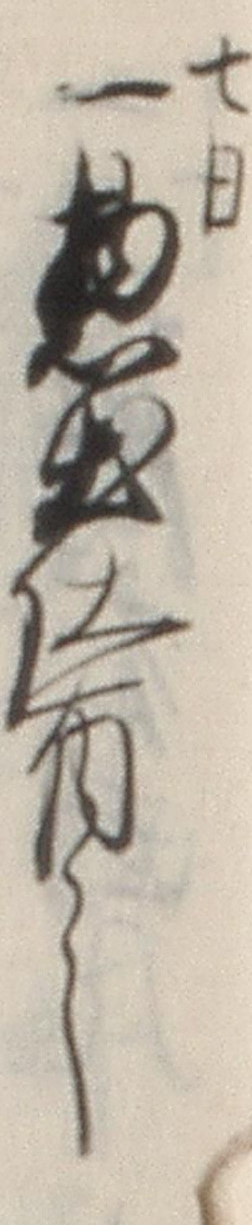一惣出仕有之
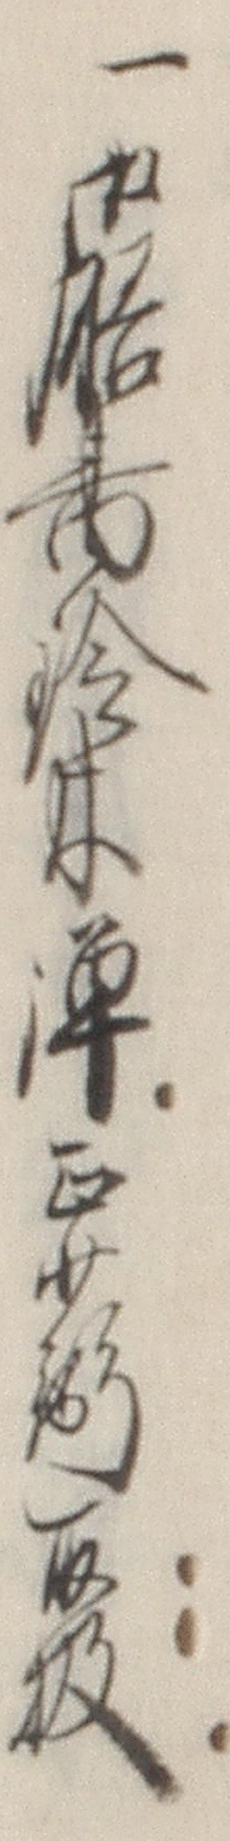一御膳番鈴木弾正少弼取扱
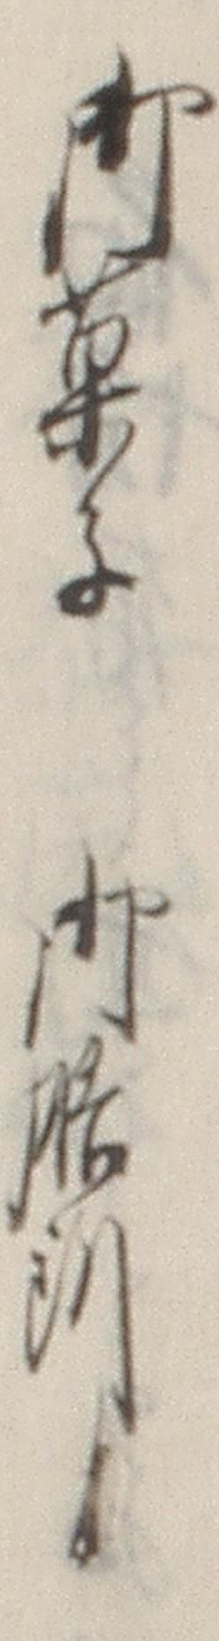御菓子御膳所ゟ
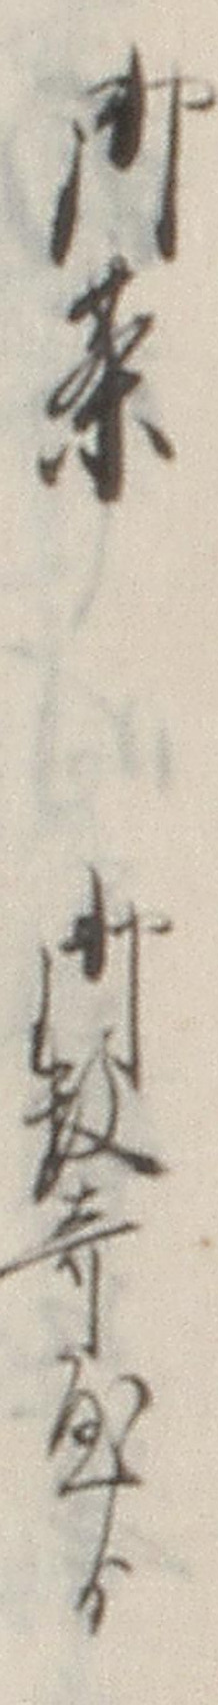御茶御数奇屋ゟ
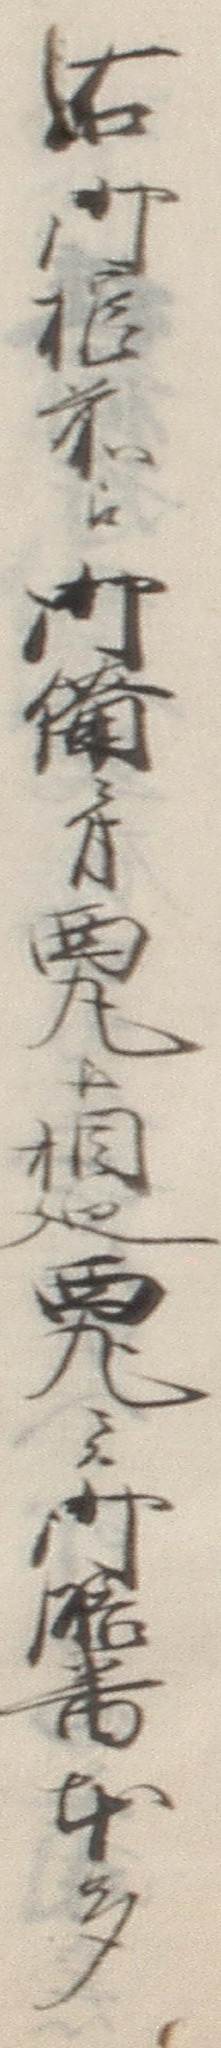右御棺前ヘ御備ニ付西丸へ相廻西丸ニ而御膳番本多
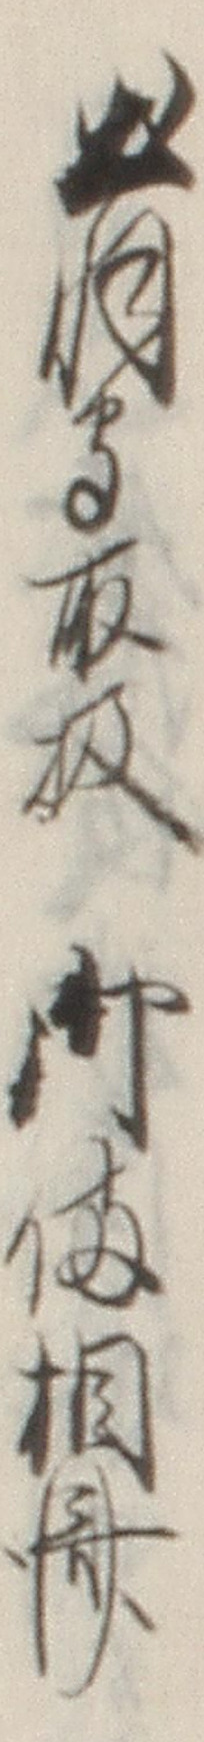出羽守取扱御備相済
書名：[諸国災害記録]
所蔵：東京大学地震研究所図書室 Earthquake Research Institute Library, The University of Tokyo, JAPAN
